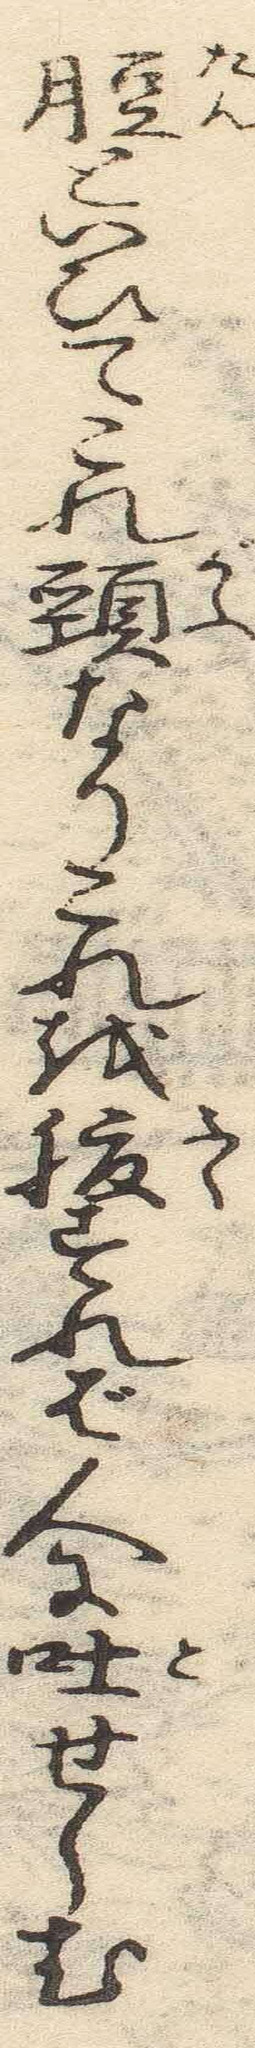脰といひてこれ頸なりこれを腹すれば人に吐せしむ
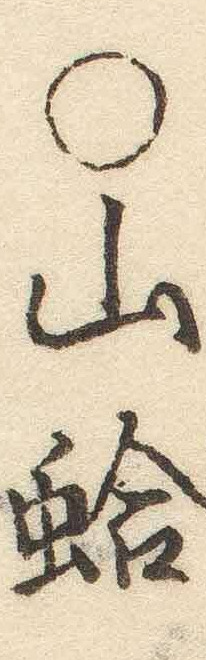○山蛤
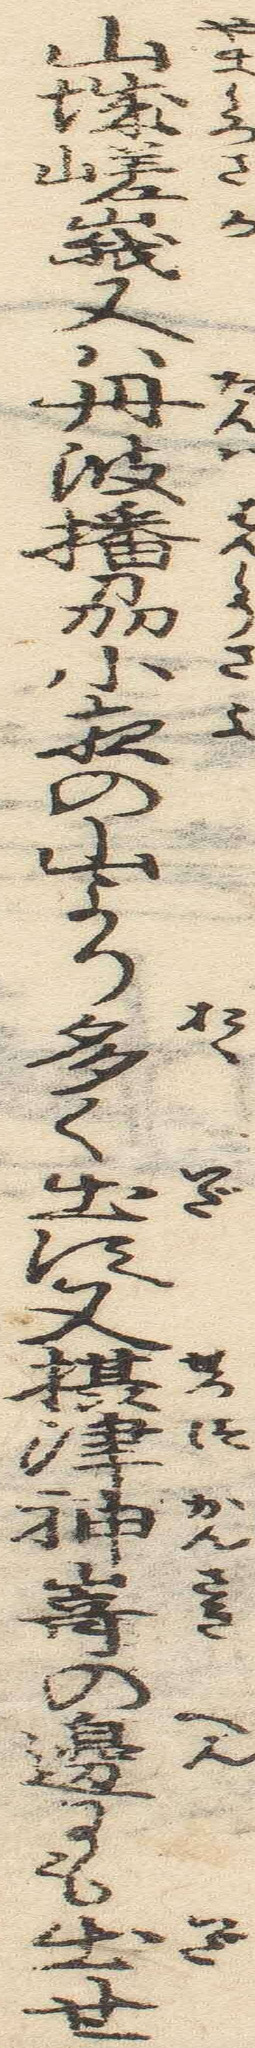山城嵯峨又は丹波播州小夜の山より多く出す摂津神崎の辺にも出せ
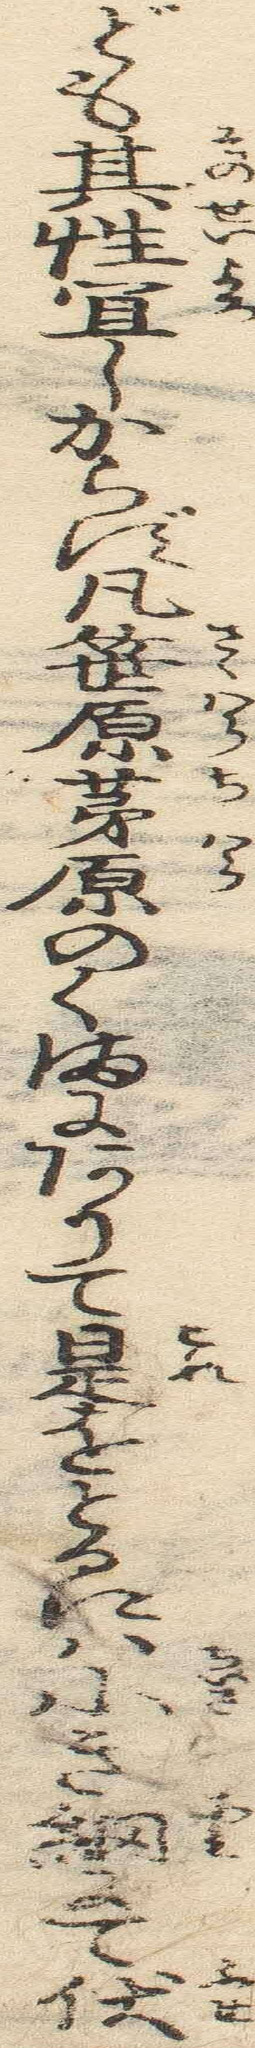ども其性宜しからず凡笹原茅原のくまにありて是をとるには小き網にて伏
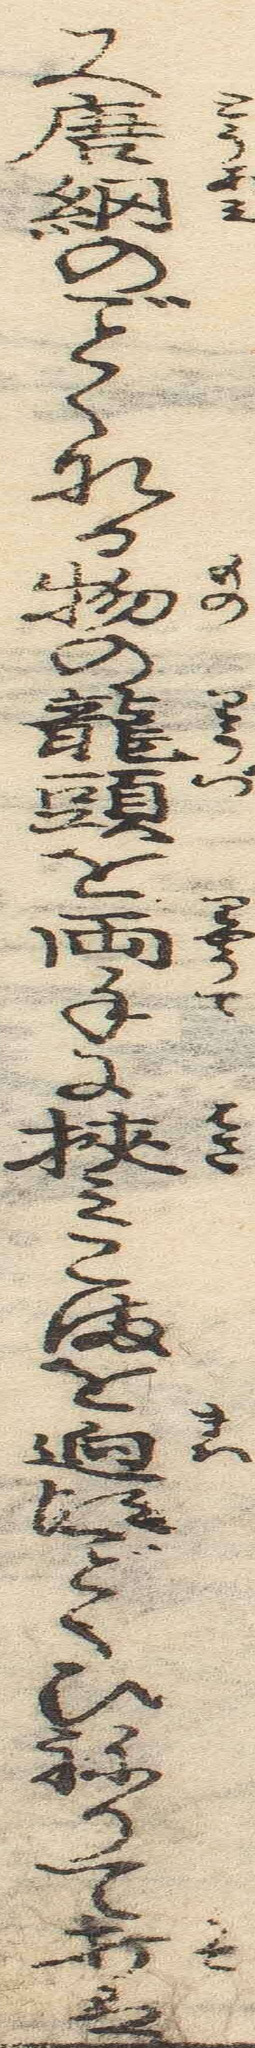又唐網のごとくなる物の竜頭を両手に挟みこまを廻すごとくひねりて打は
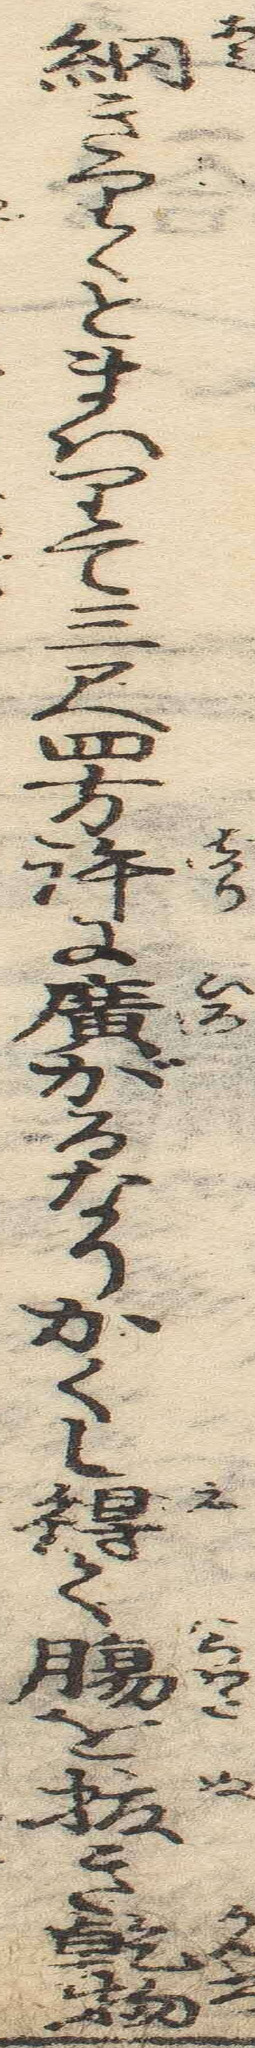網きりゝとまはりて三尺四方許に広がるなりかくし得て膓を抜き乾物
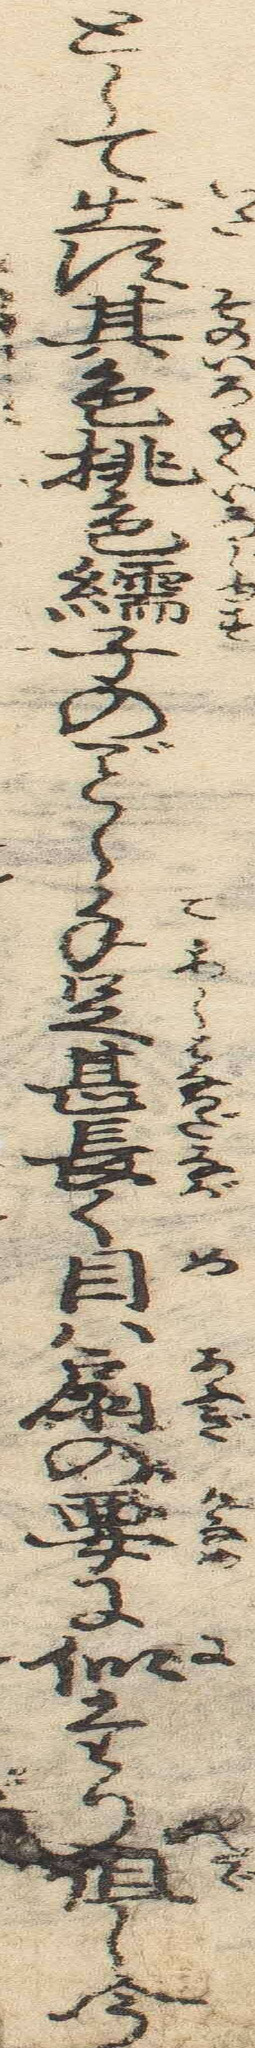として出す其色桃色繻子のごとし手足甚長く目は扇の要に似たり但し今
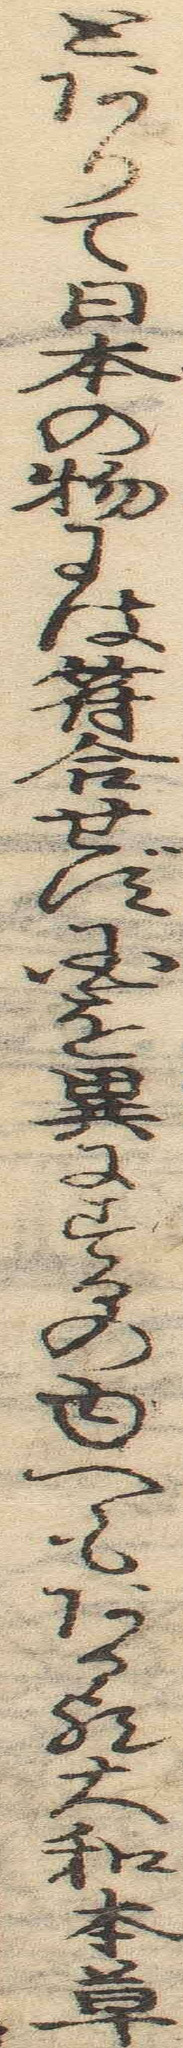とありて日本の物には符合せず国を異にするのゆへもある欤大和本草

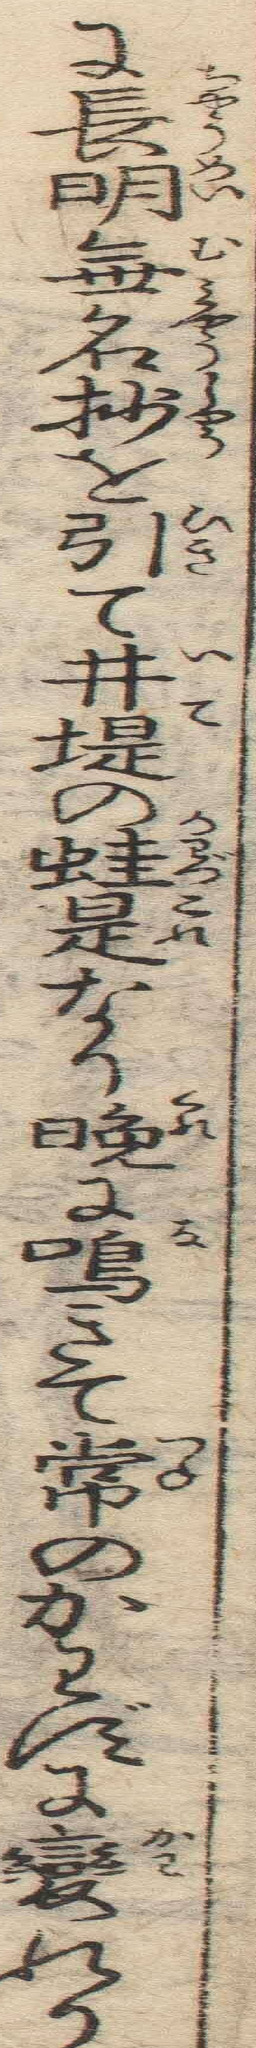に長明無名抄を引て井堤の蛙是なり晩に鳴きて常のかわずに変れり
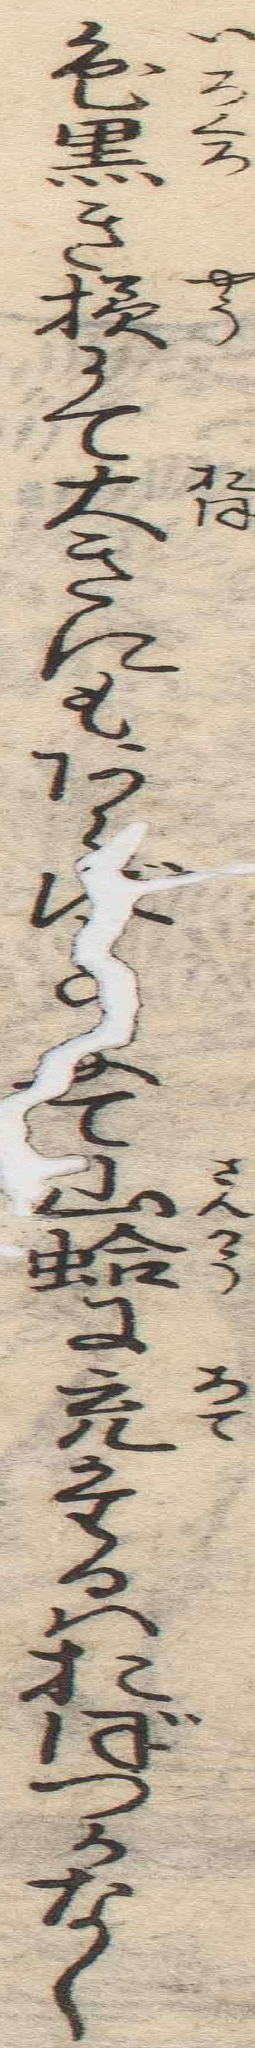色黒き様にて大きにもあらずふて山蛤に充たるはおぼつかなし
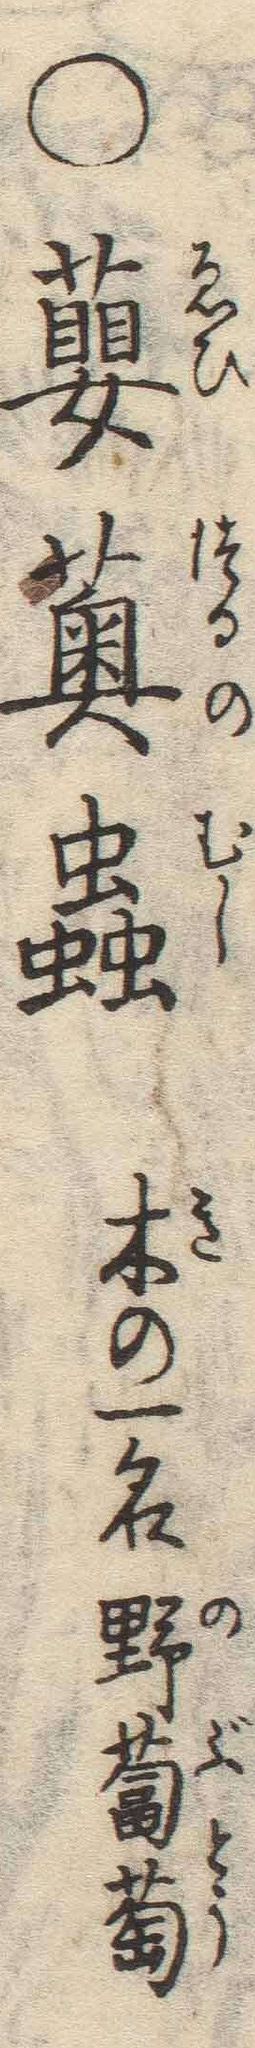○蘡薁虫木の一名野葡萄
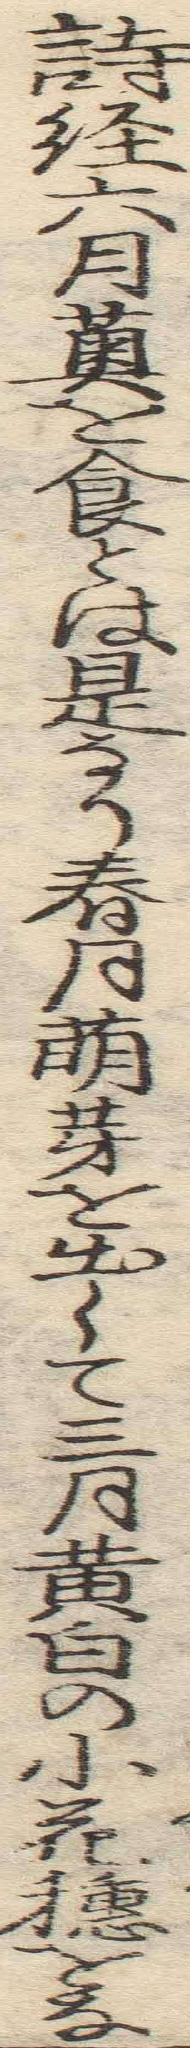詩経六月薁を食とは是なり春月萌芽を出して三月黄白の小花穂をな
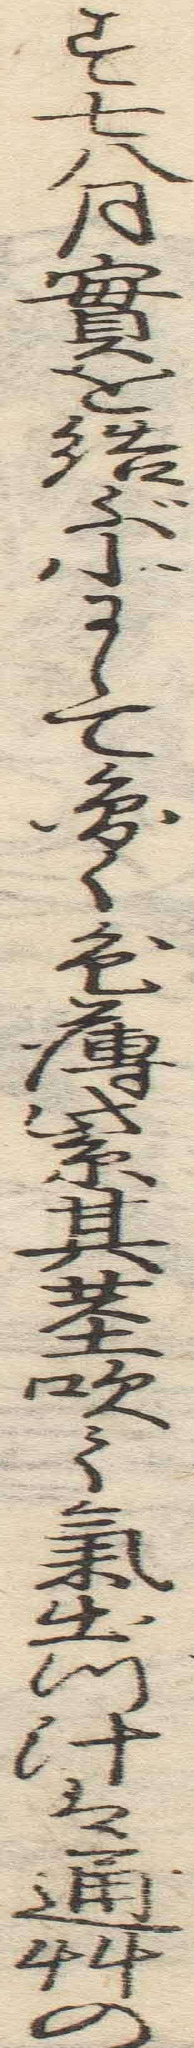す七八月実を結ぶ小にして円く色薄紫其茎吹て気出づ汁は通草の
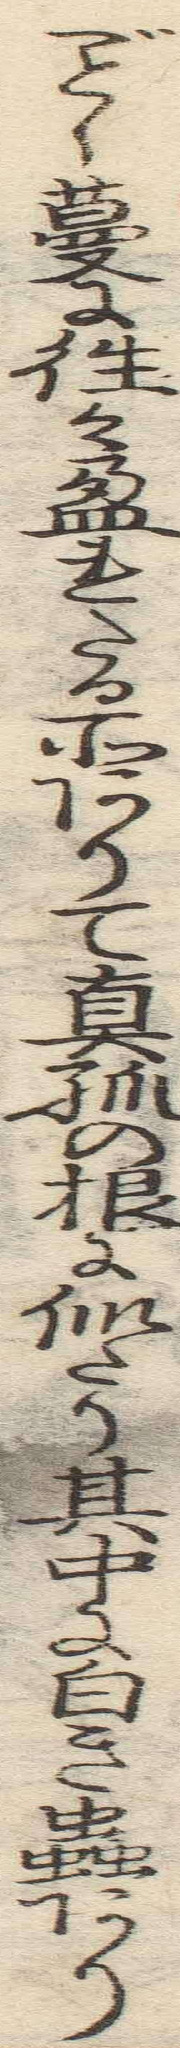ごとし蔓に往々盈れたる所ありて真菰の根に似たり其中に白き虫あり
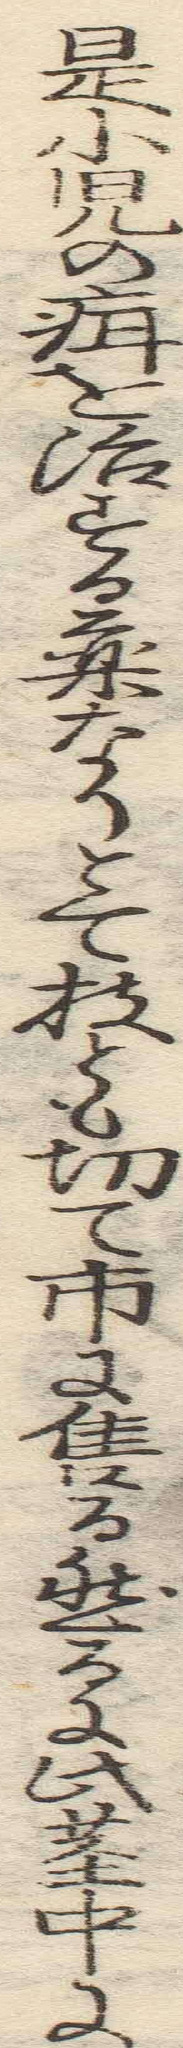是小児の疳を治する薬なりとて枝とも切て市に售る然るに此茎中に
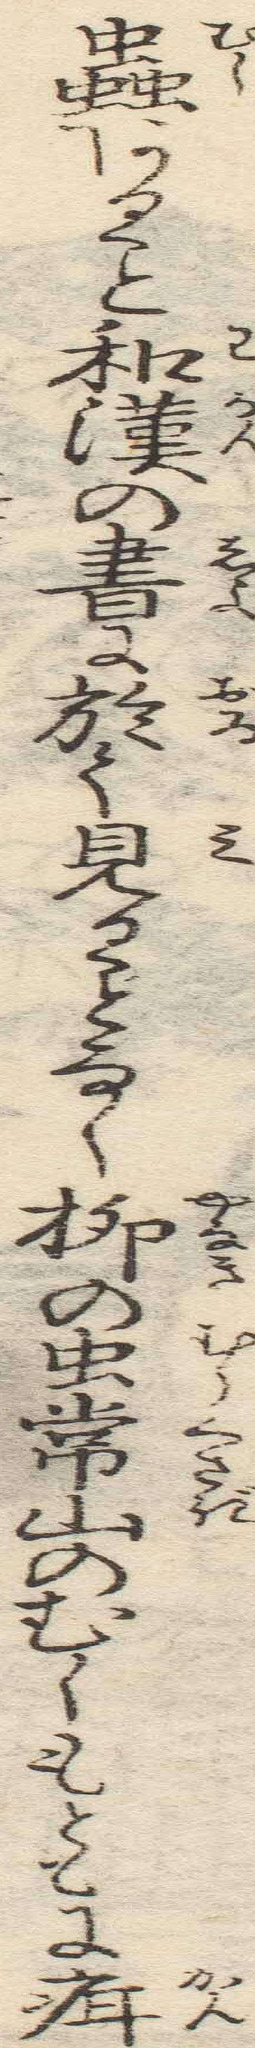虫あること和漢の書に於て見ることなし柳の虫常山のむしもともに疳
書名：日本山海名産図会
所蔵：東京学芸大学附属図書館 国文学研究資料館
